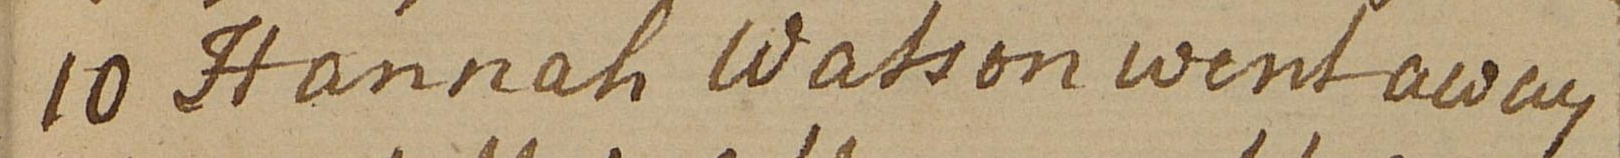10 Hannah Watson went away
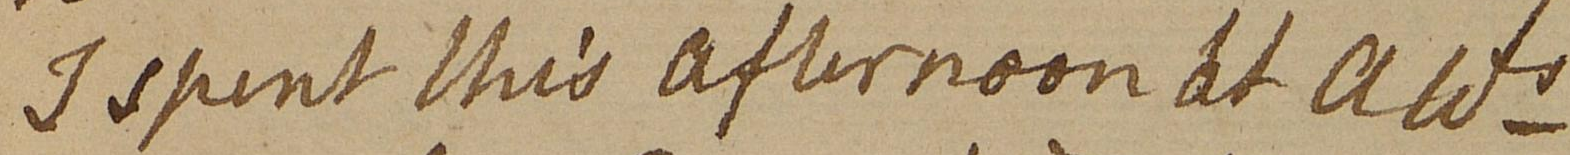I spent this afternoon at AW^s
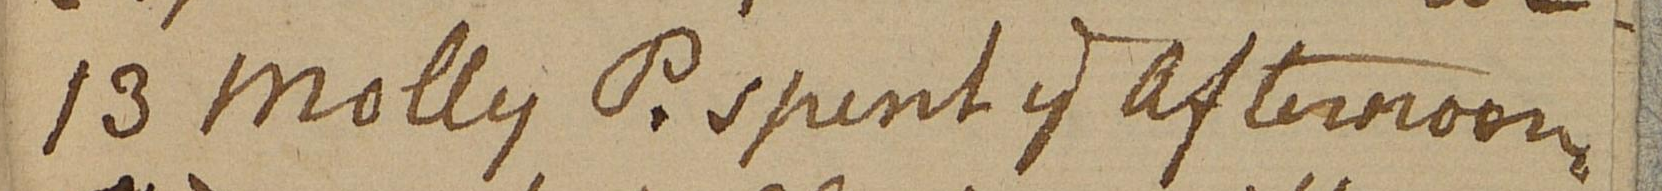13 Molly P. spent y^e afternoon,
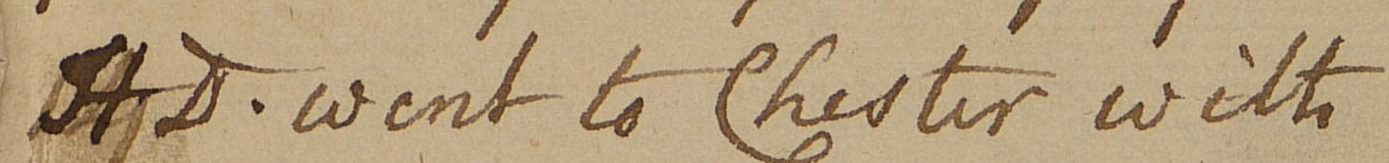HD. went to Chester with
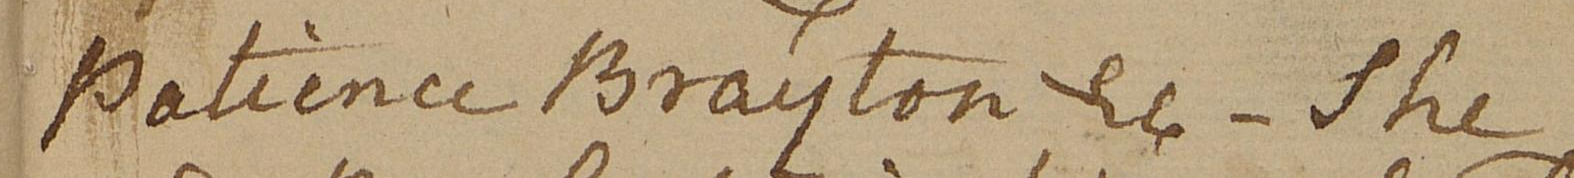patience Brayton &c- She
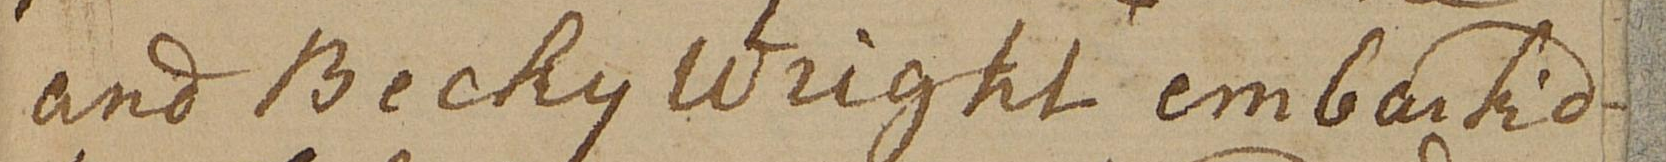and Becky Wright embark'd
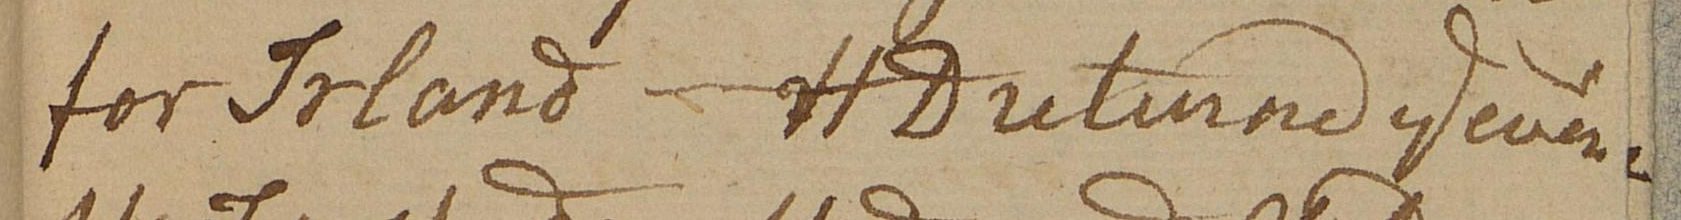for Irland- HD returnd y^e even^g
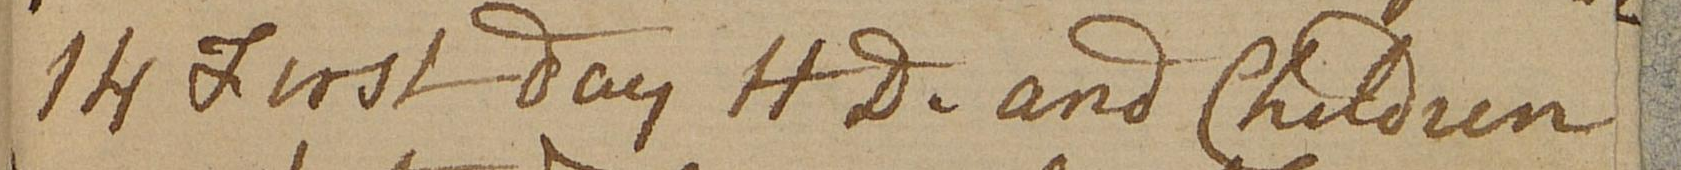14 First bay HD- and Children
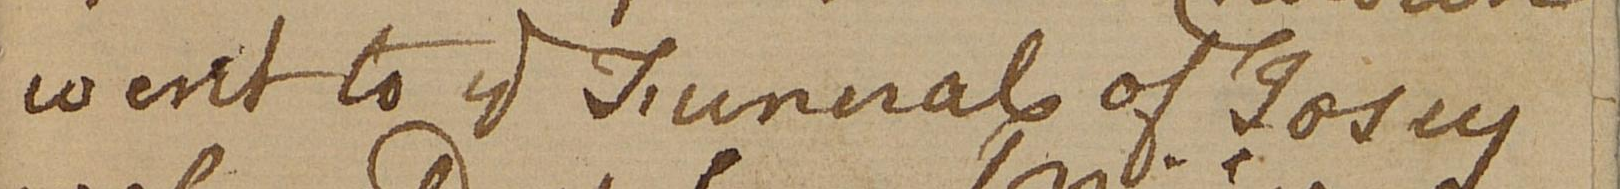went to y^e Funeral of Josey
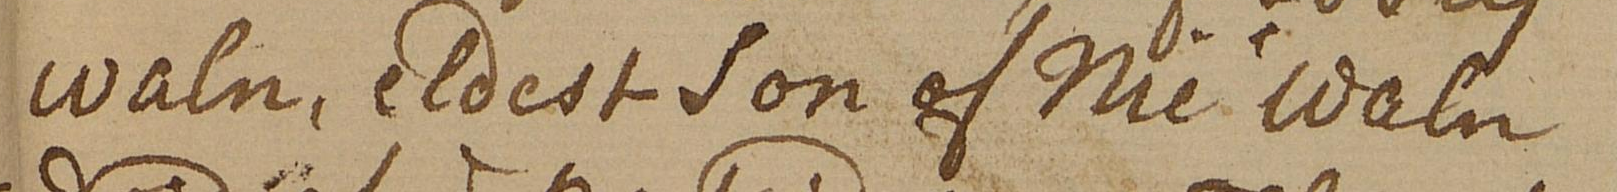Waln, eldest Son of Nic Waln
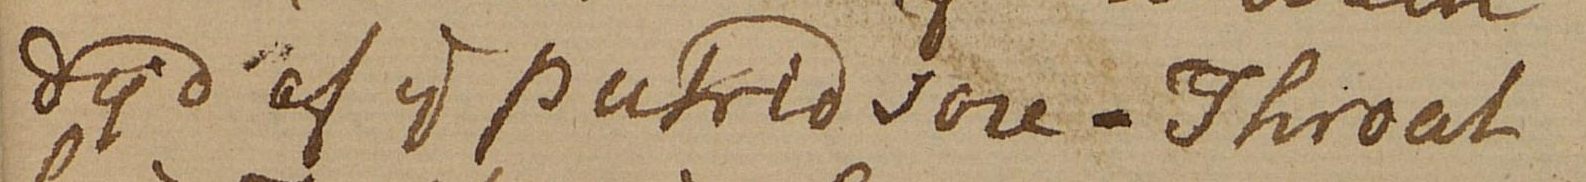dy'd of ye putrid sore- Throat
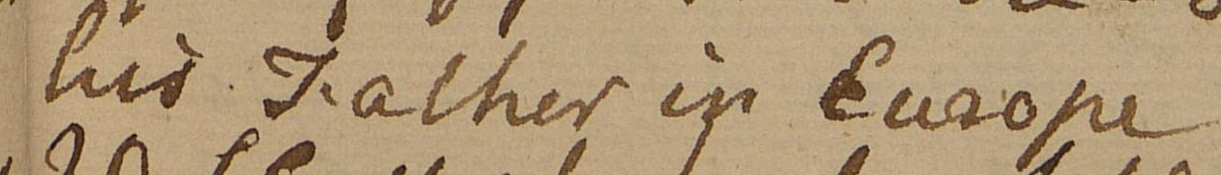his Father in Europe
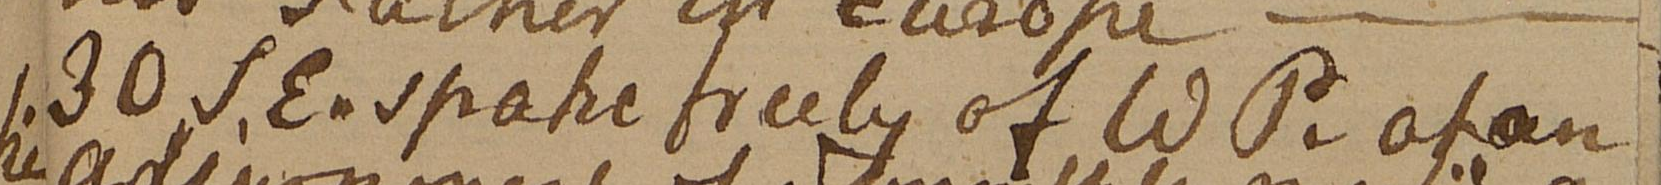30 S.E. spake freely of WP. afar
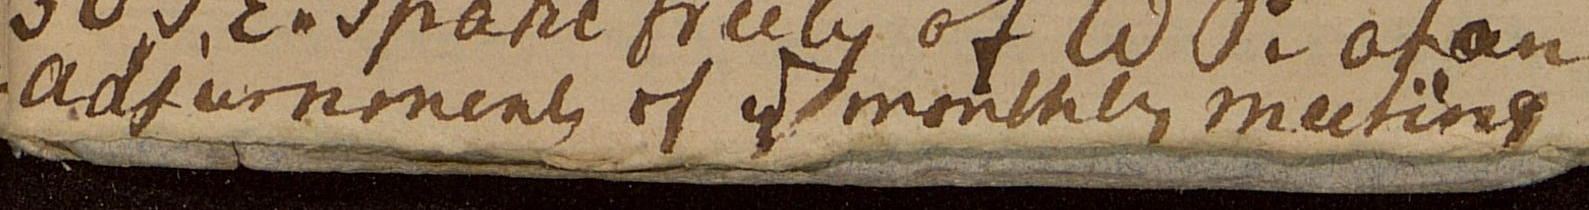adjurnment of y^e monthly meeting
